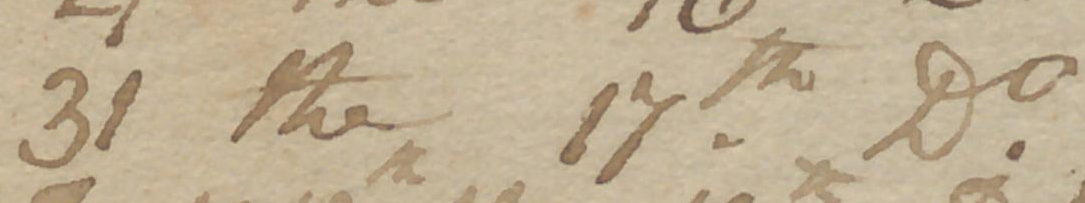31 the 17^th. D^o.
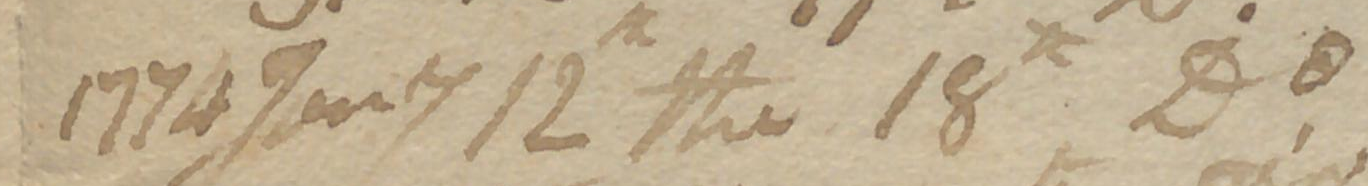1774 Jan^y 12^th the 18^h D^o.
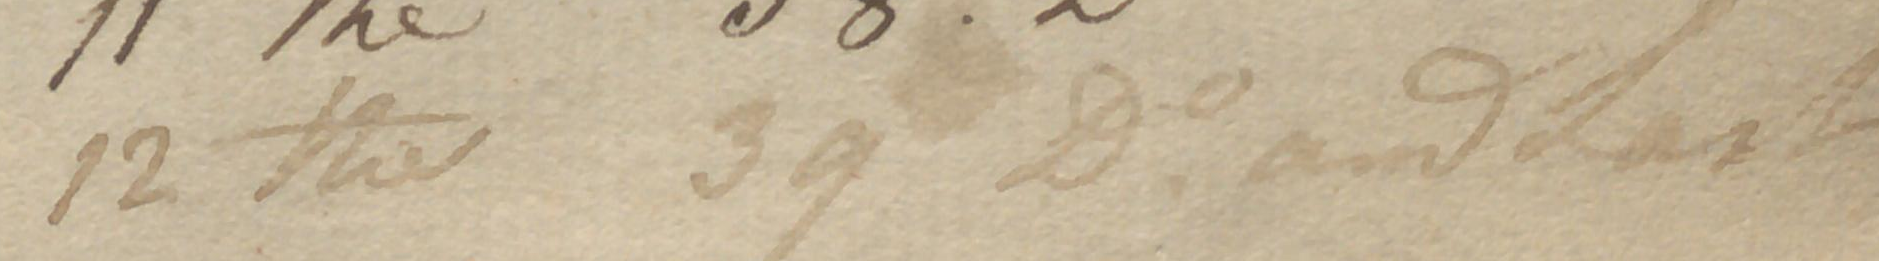12 39 D^o and Last
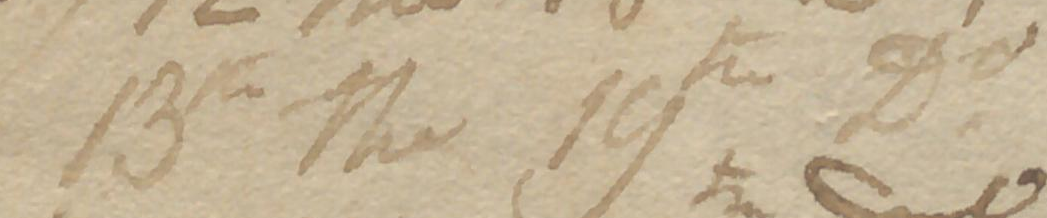13^th the 19^th D^o.
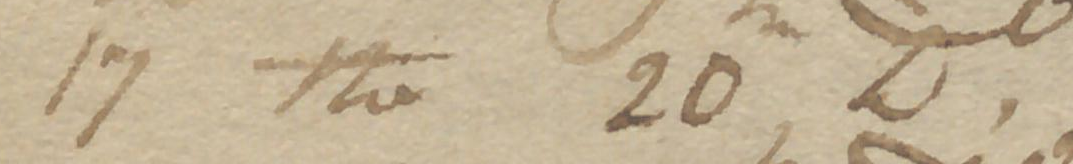17 the 20^th D^o.
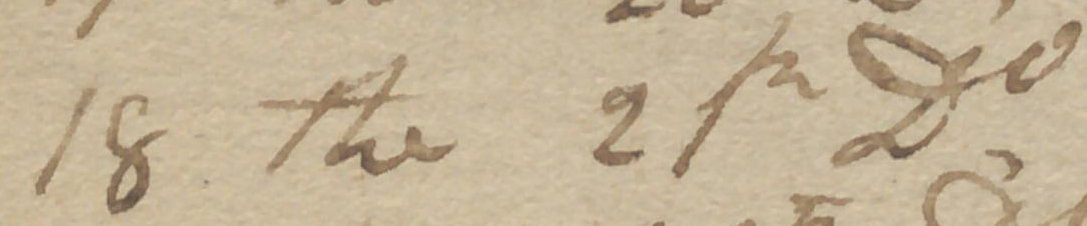18 the 21^th D^o.
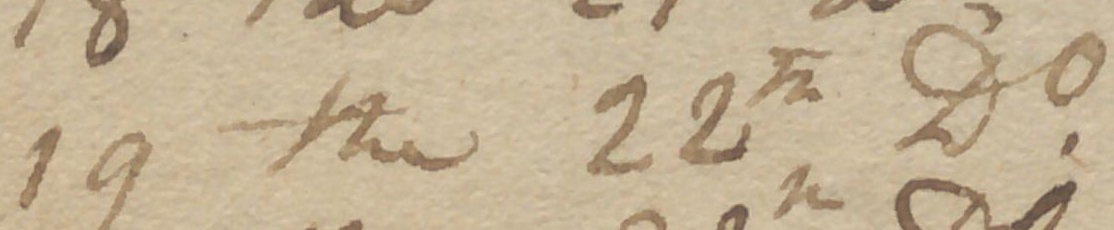19 the 22^th. D^o.
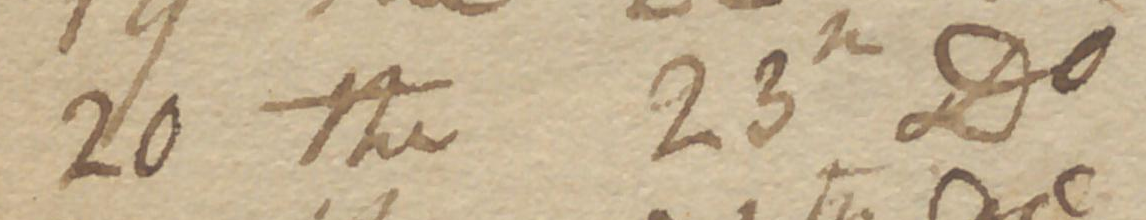20 the 23^th D^o
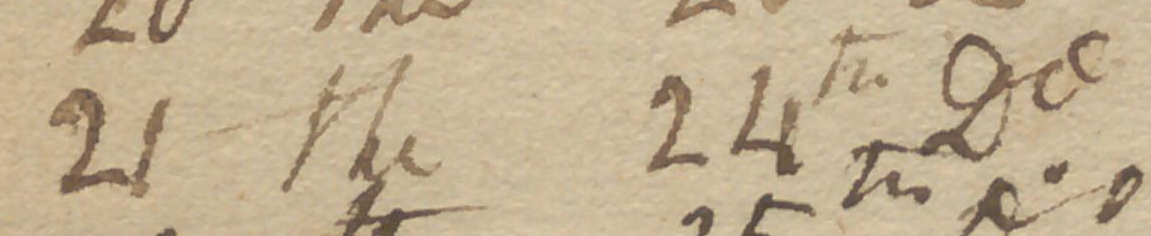21 the 24^th. D^o
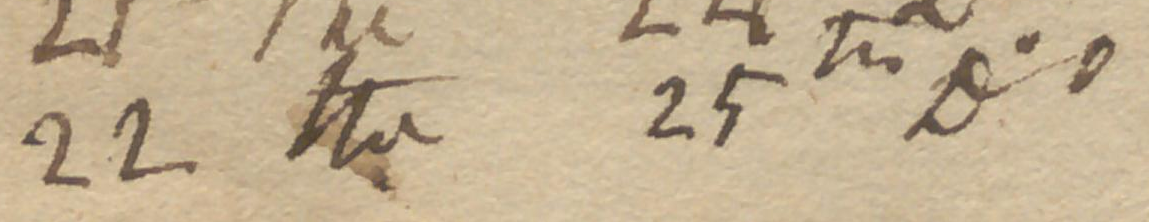22 the 25^th D^o
